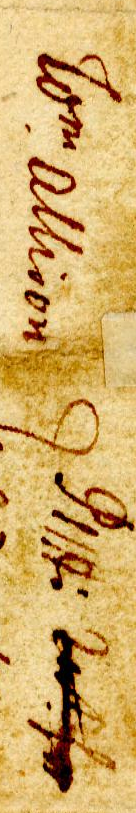W^m. Allison Pellll: Rect for
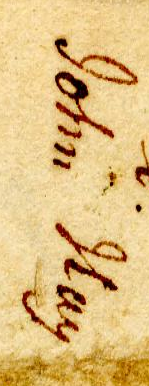John Hay
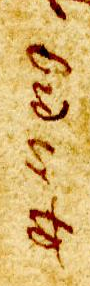Order to
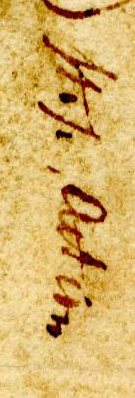Stop Action
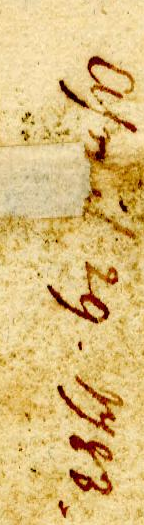April 29. 1783.
